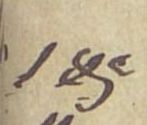1 &c
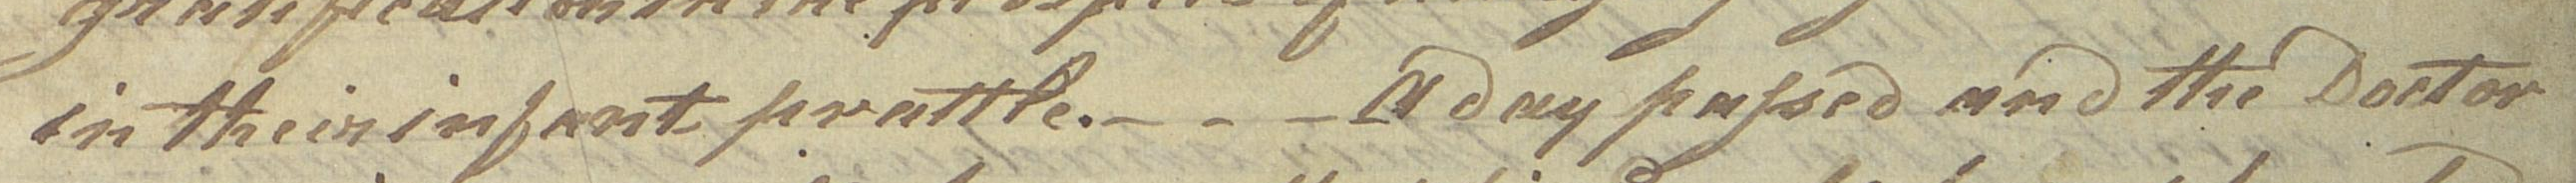in their infant prattle. A day passed and the Doctor
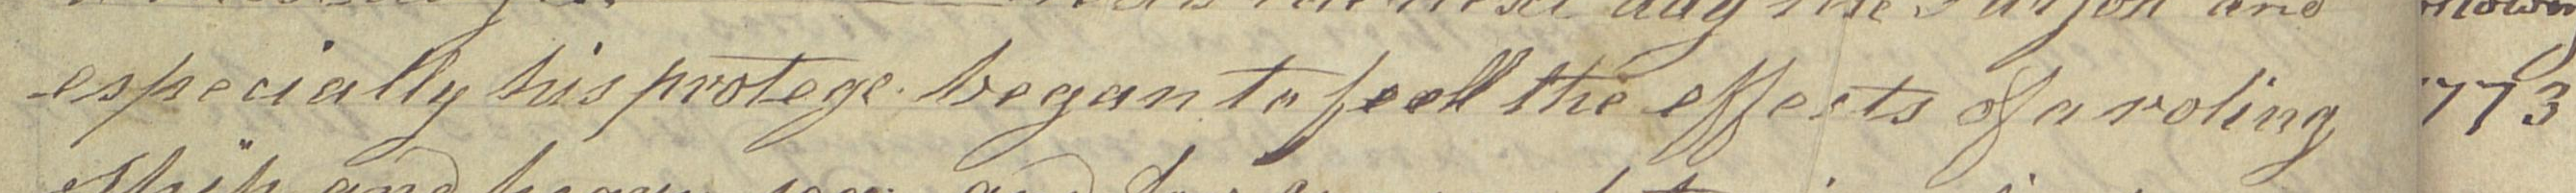especially his protege began to feel the effects of a roling 773
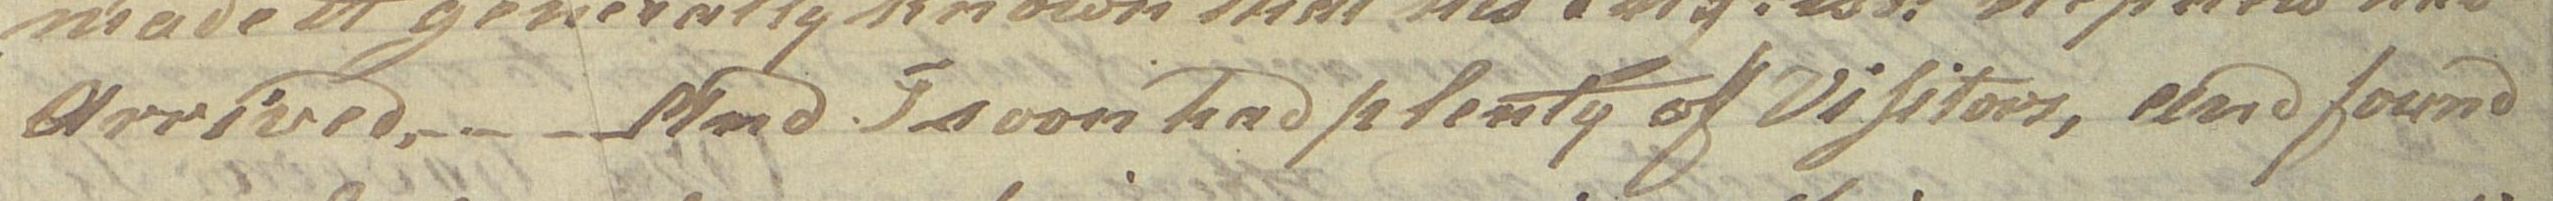Arrived--- And I soon had plenty of Visitors, and found
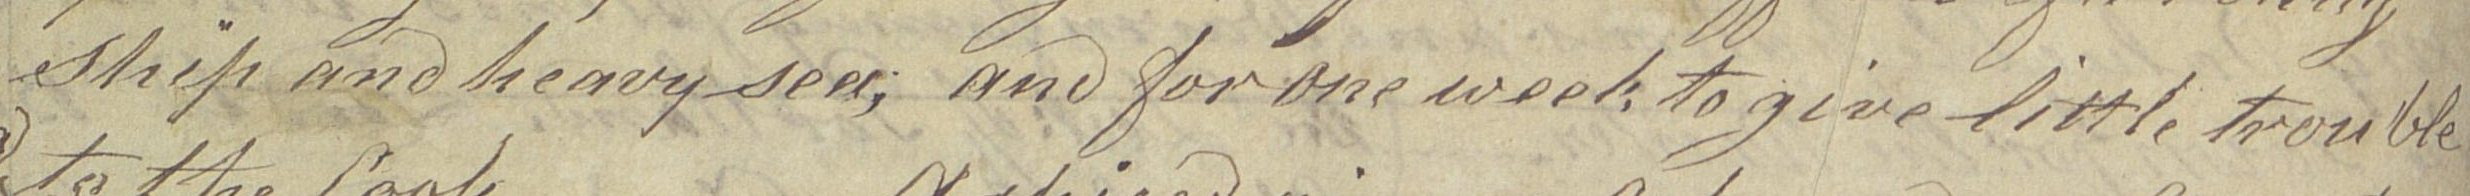ship and heavy sea, and for one week to give little trouble
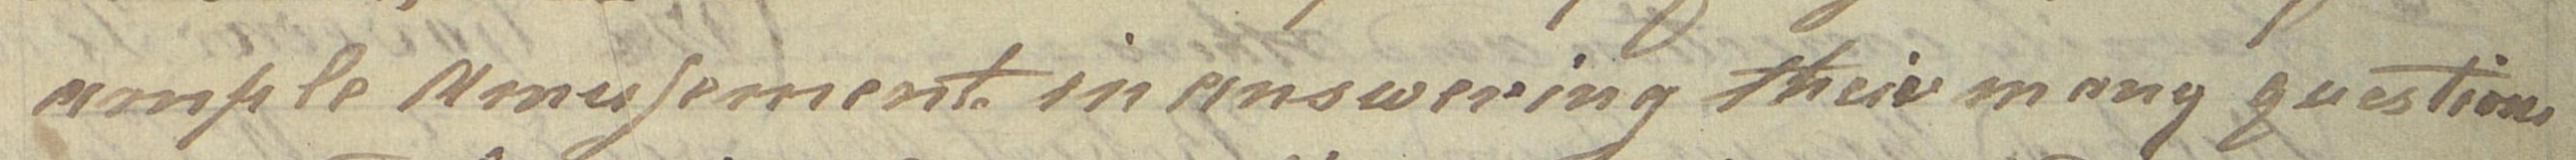ample Amusement in answering their many questions
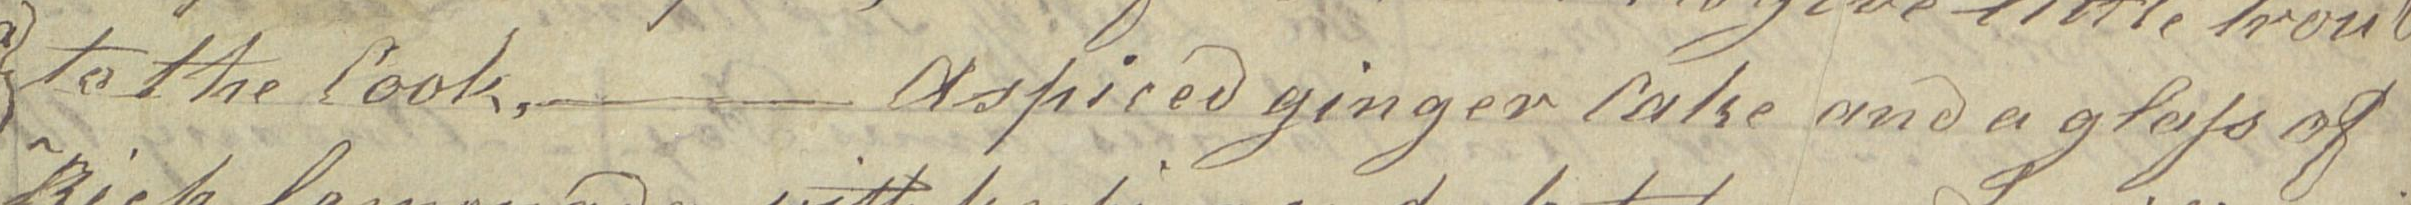to the Cook A spiced ginger Cake and a glass of
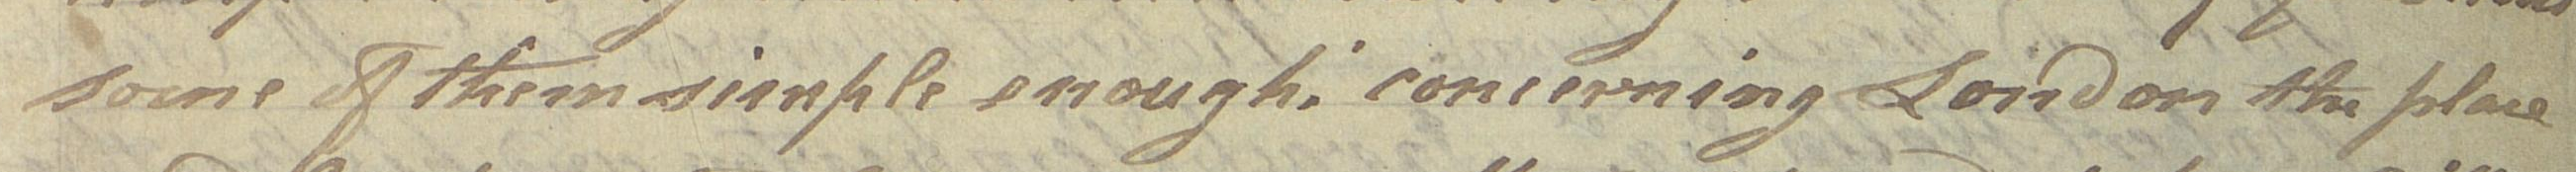some of them simple enough concerning London the place
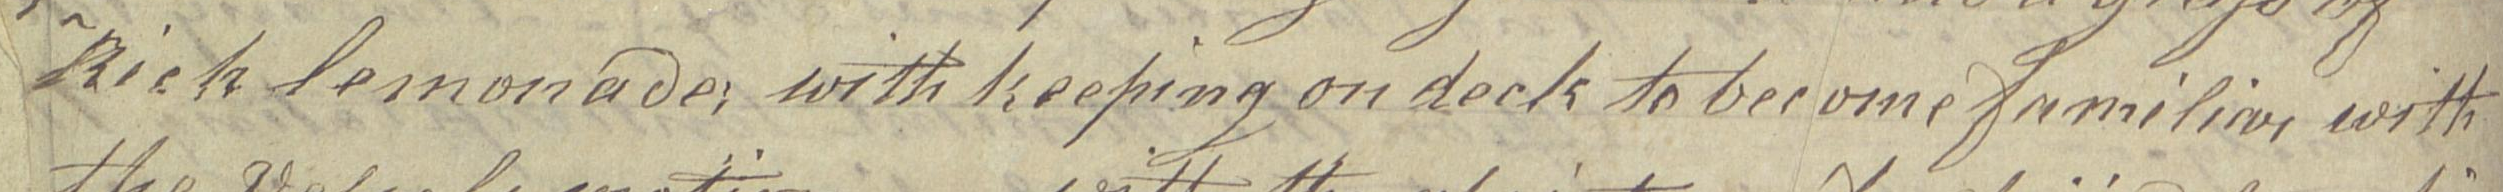Rich lemonade with keeping on dock to become familiar with
